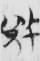敓
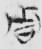周
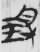○（瑶）
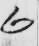㠯（以）
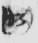○（廷）
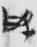阩
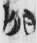門
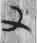又
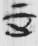正
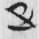疋
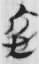忻
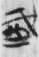戠
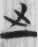之
